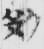死
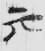亓（其）
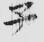子
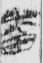番
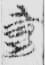步
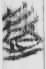○（後）
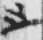之
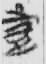步
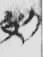死
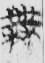無
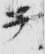子
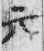亓（其）
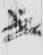弟
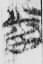番
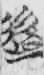○（後）
